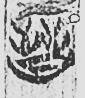晉
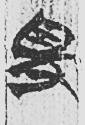{且又}
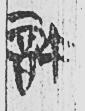許
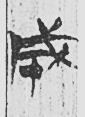成
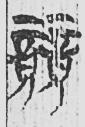競
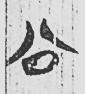公
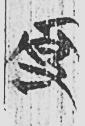史
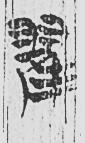翟
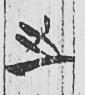之
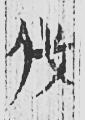伐
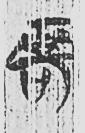{口甹}
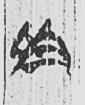於
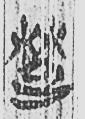楚
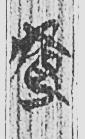虘B
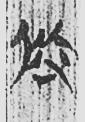攸
